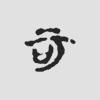可
